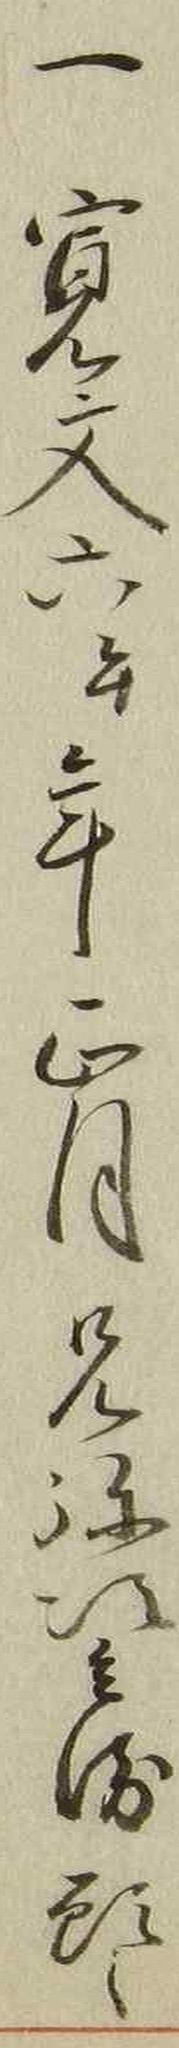一寛文六午年正月兄弥次兵衛願之
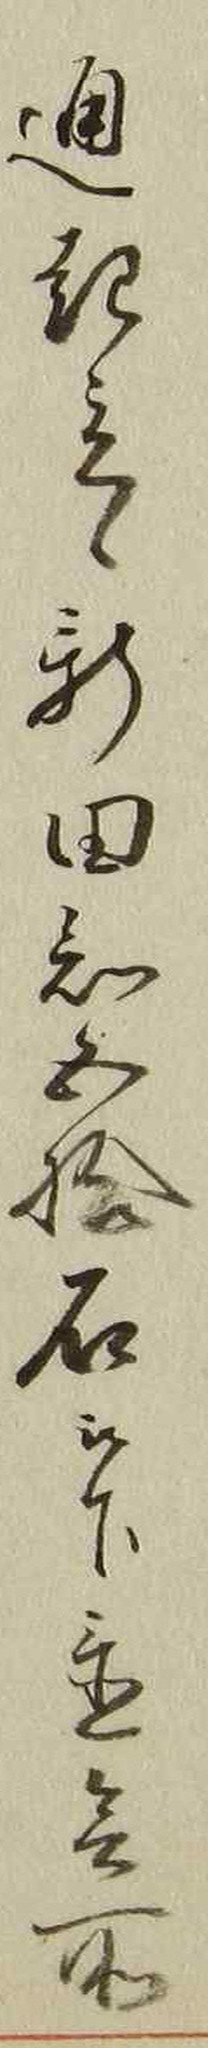通起立之新田知五拾石被下置会所
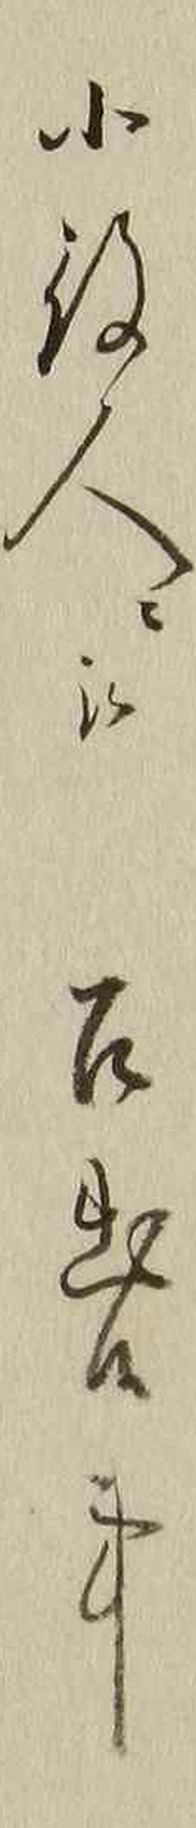小役人ニ被召出候事
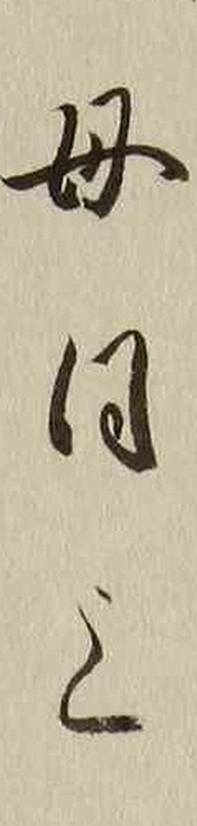母同上
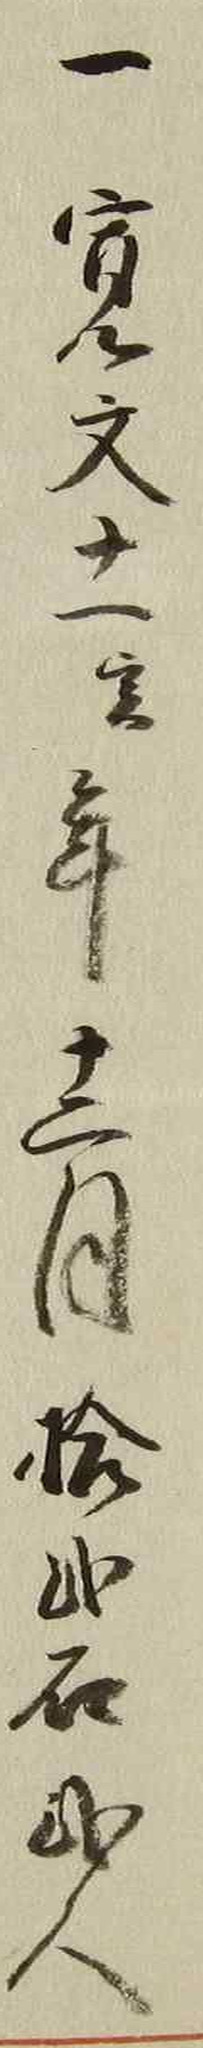一寛文十一亥年十二月拾弐石弐人
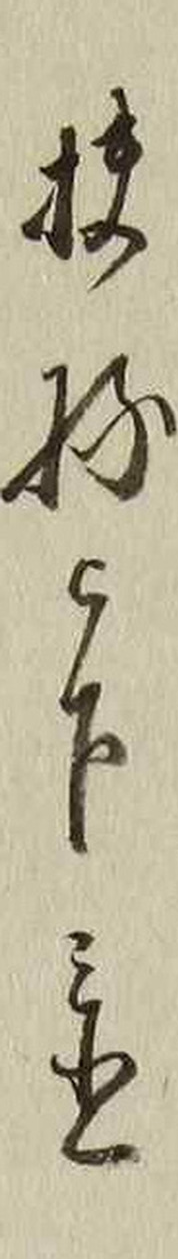扶持被下置
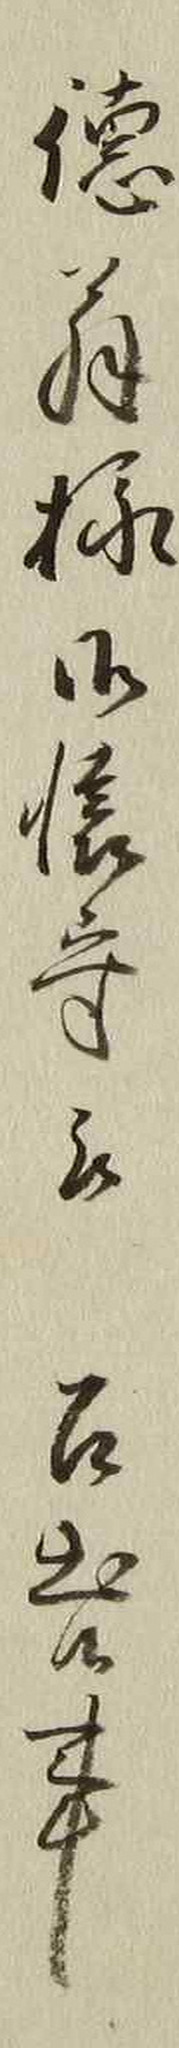徳翁様御懐守被召出候事
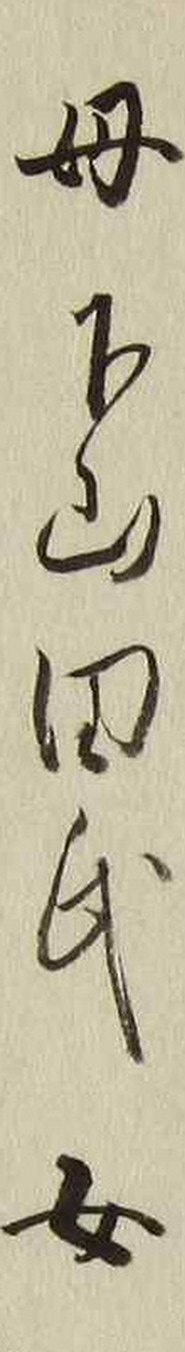母下山田氏女
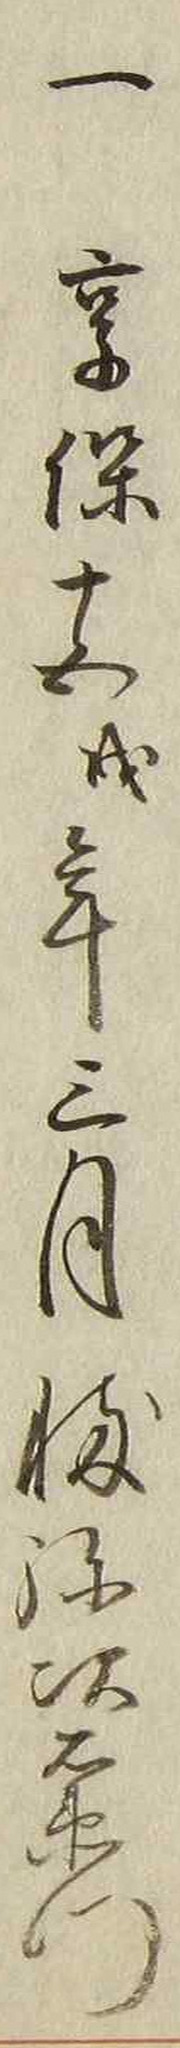一享保十五戌年三月忰弥次右衛門

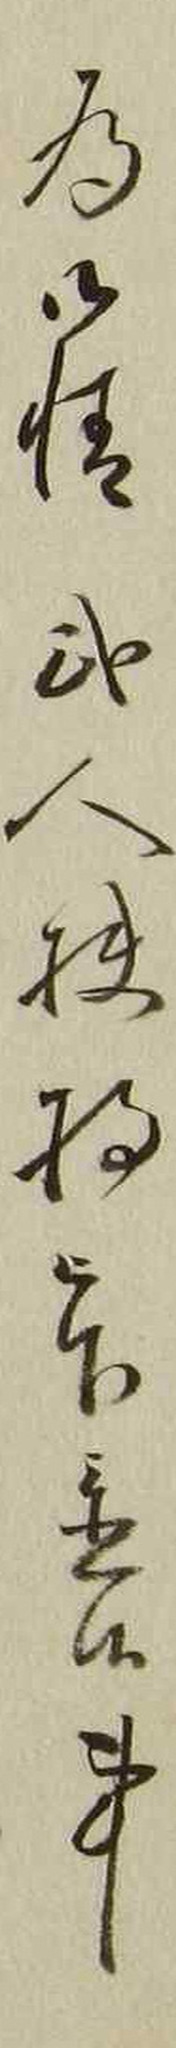為御情弐人扶持被下置候事
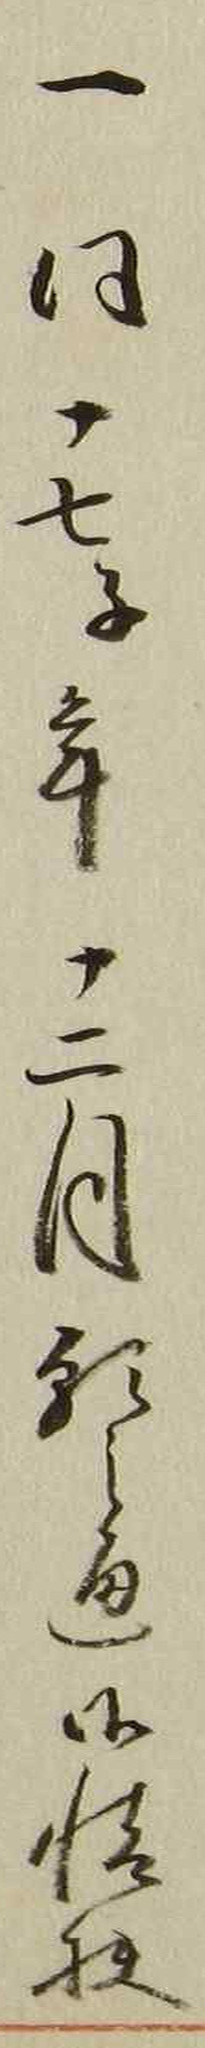一同十七子年十二月願之通御情扶
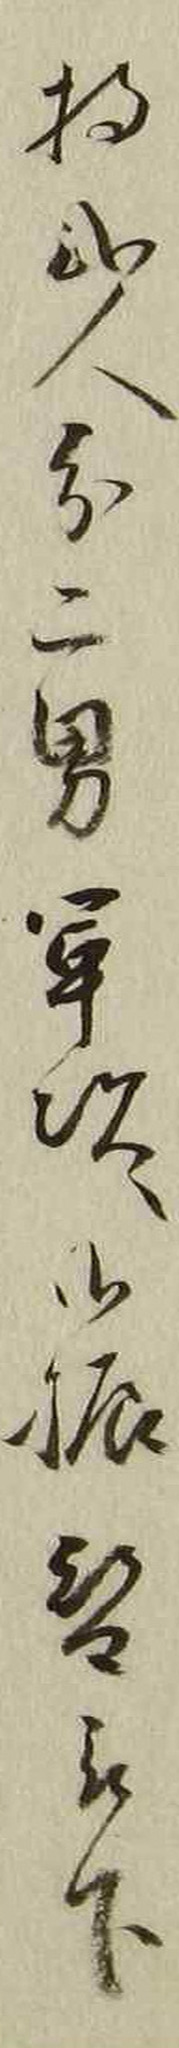持弐人分二男軍次へ御振替被下
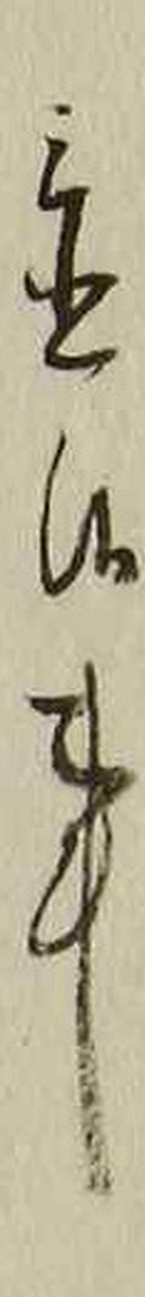置候事
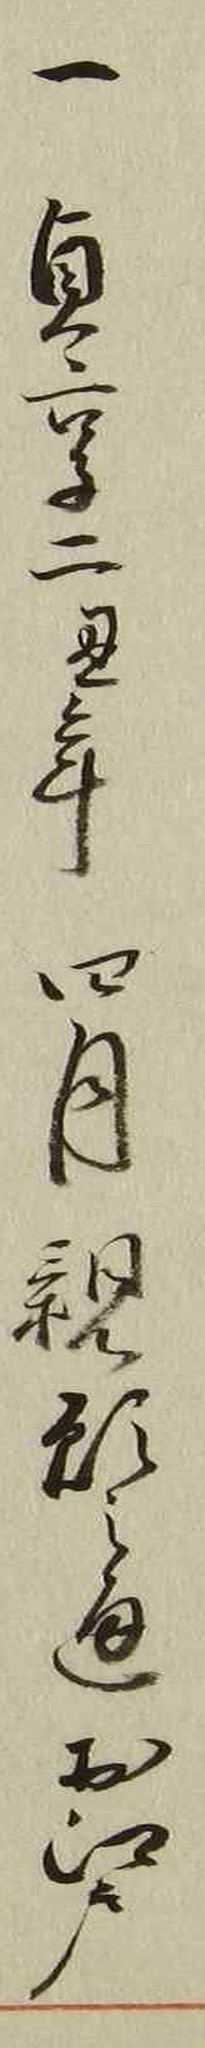一貞享二丑年四月親願之通於江戸
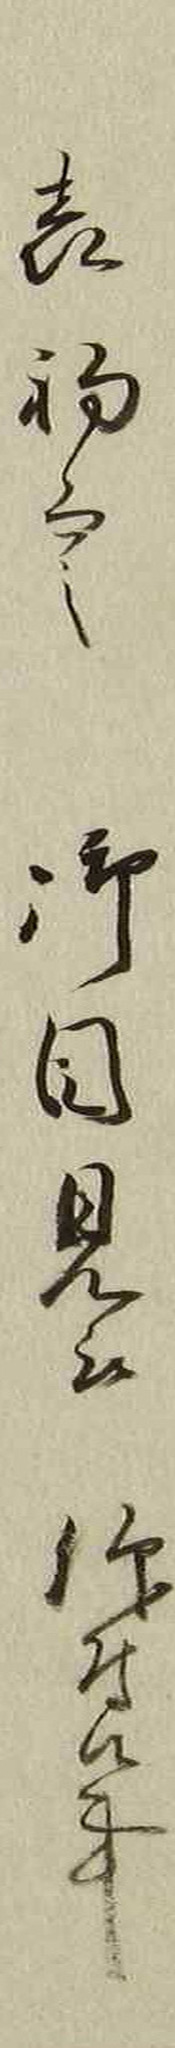表初而之御目見被仰付候事
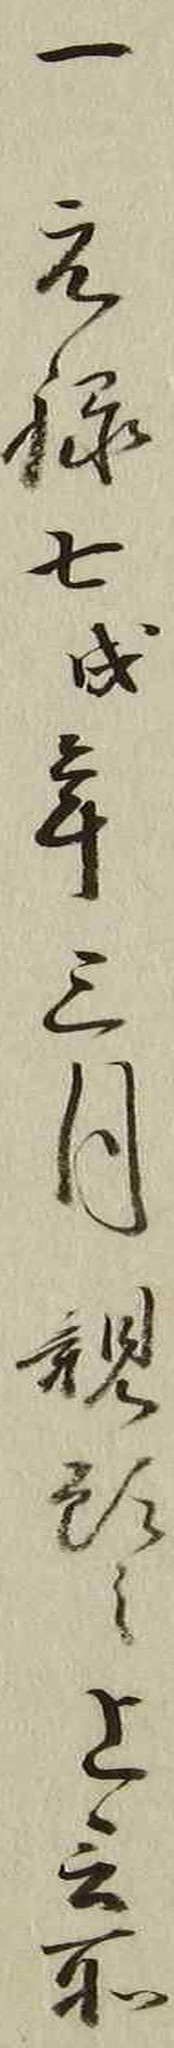一元禄七戌年三月親願之上立所
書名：諸士系譜　巻之32　い之部32
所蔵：会津若松市立会津図書館
